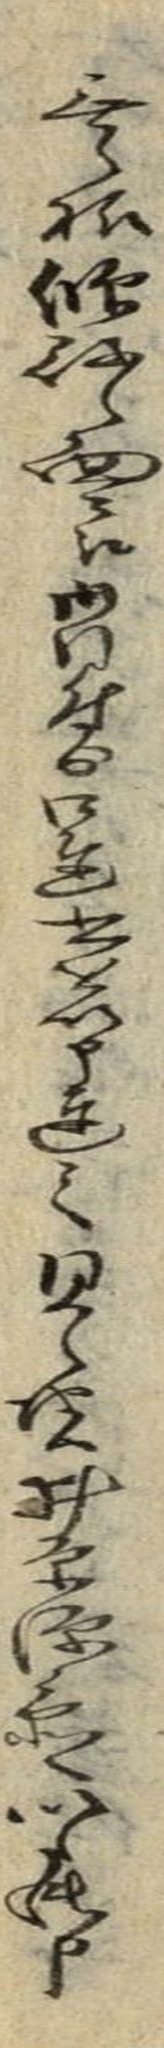無之様師役之面々え御目付ゟ口達書を以申達之貝之儀は井原源兵衛へ以手紙申
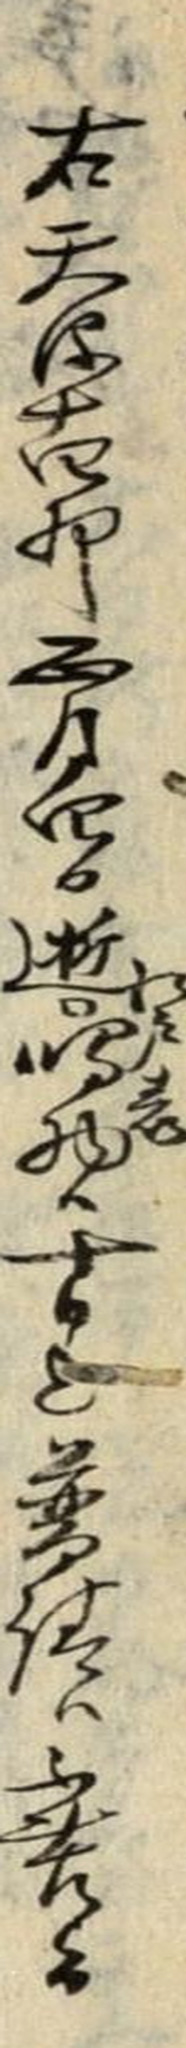右天保十四卯正月四日逝◦江戸表鳴物は十日迄普請は不苦旨
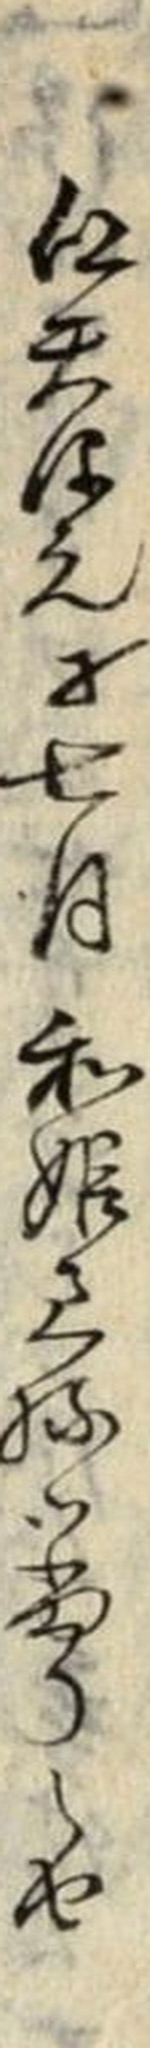但天保元刁七月和姫君様御当り之由
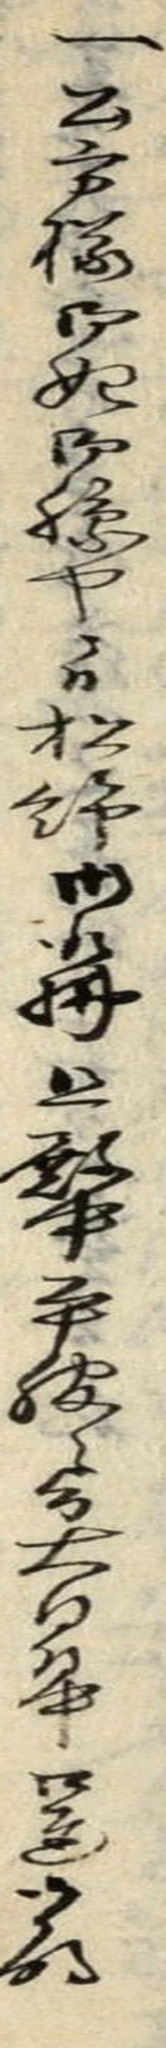一公方様御始御朦中に付松飾御取払且殿中平服之旨大目付中口達御触
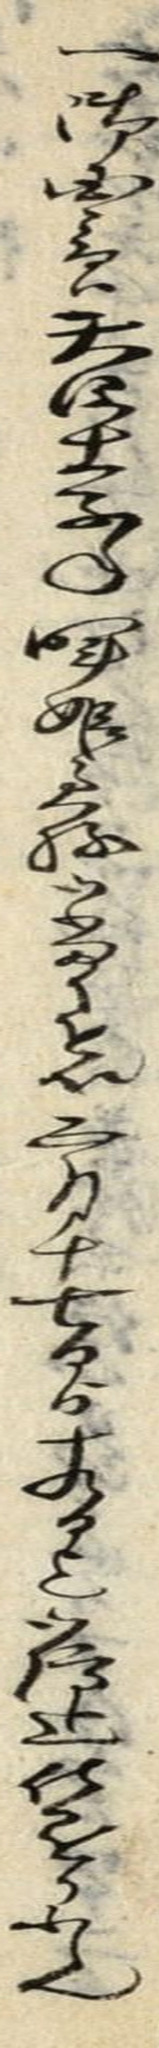一御国にては天保十一子年暉姫君様御当りを以正月十七日ゟ十九日迄御停止仕懸りふしん
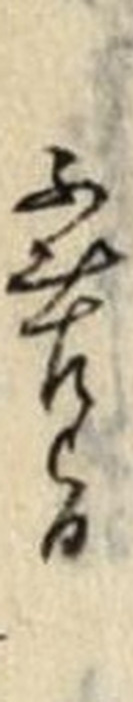不苦旨
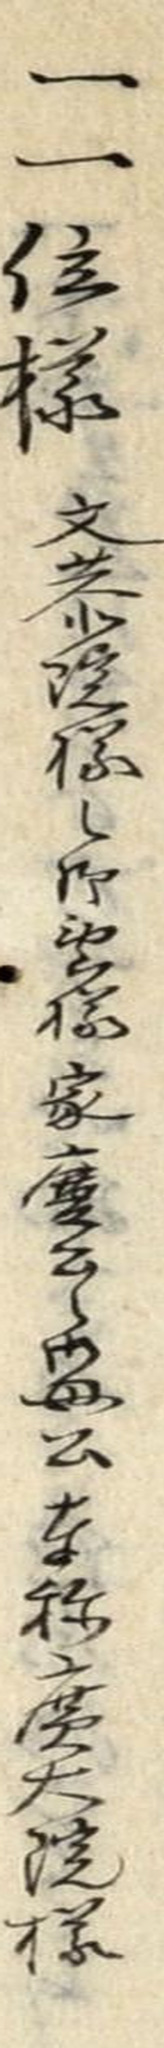一一位様文恭院様之御台様家慶公之御母公奉称広大院様
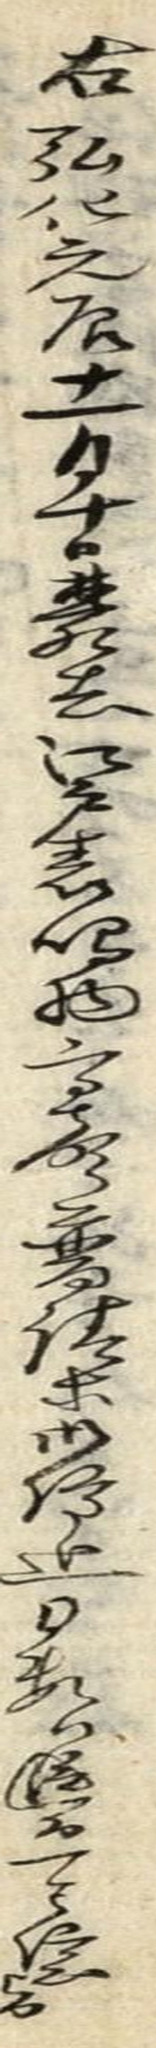右弘化元辰十一月十日薨去江戸表鳴物高声普請等御停止日数は追て可被仰出旨
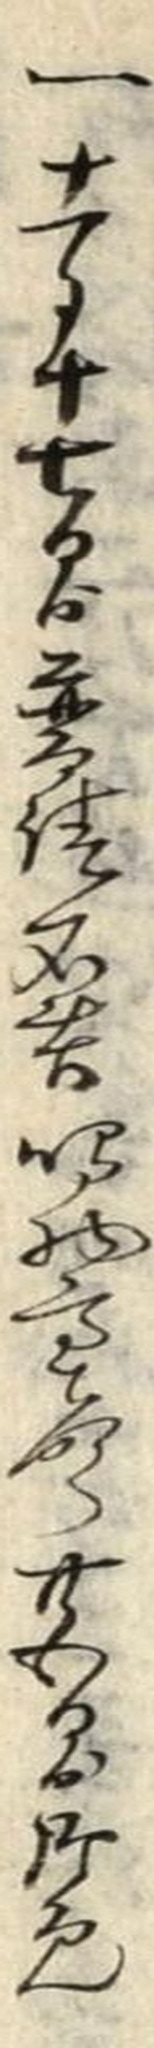一十一月十七日ゟ普請不苦鳴物高声廿五日ゟ御免
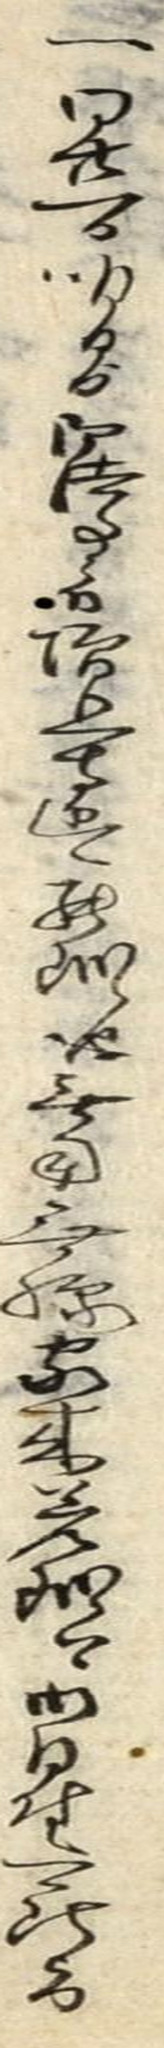一同廿一日明日ゟ御法事に付増上寺辺へ罷越候儀無用無拠家来差越候はゝ御目付へ可断旨
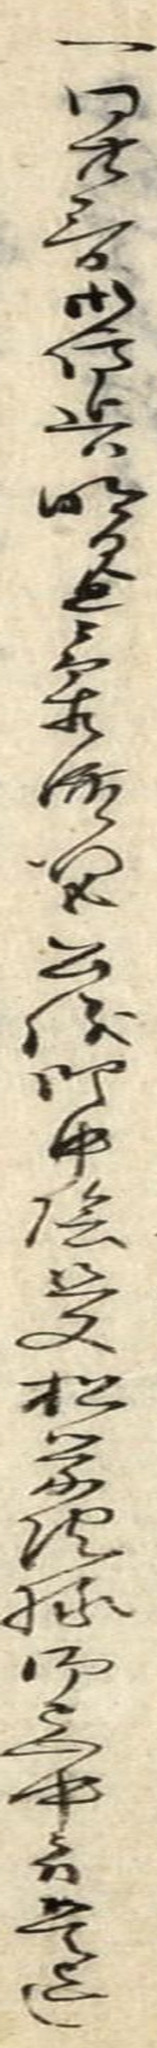一同廿三日御停止は明日迄にて相済候得共公儀御中陰且又松栄院様御忌中に付是迄之
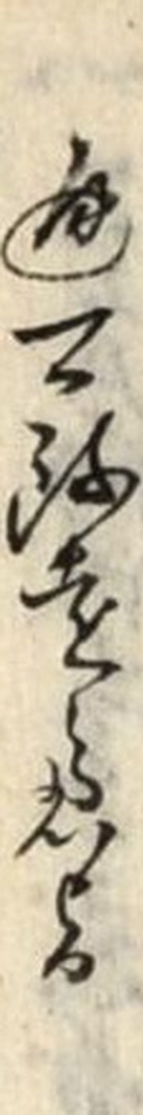通可致遠慮旨
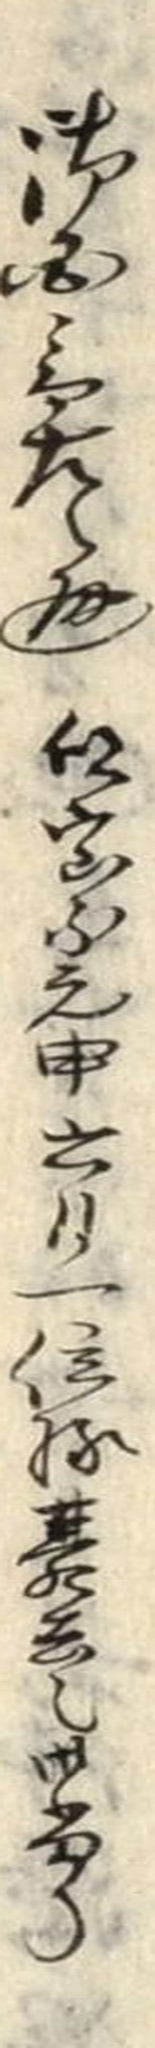御国にて左之通但宝永元申六月一位様薨去之御当り
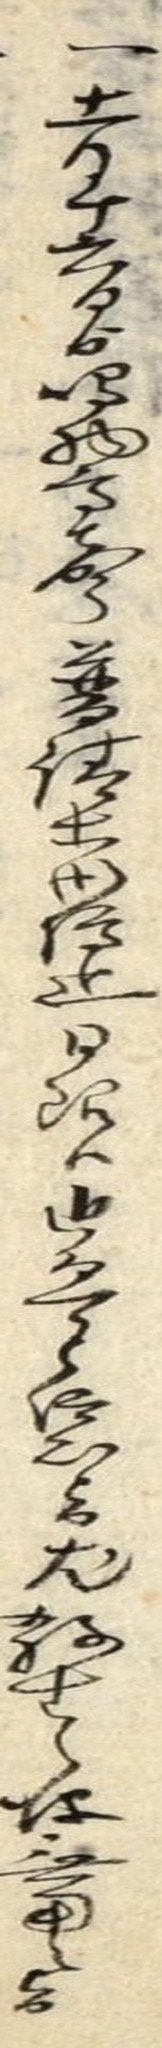一十一月十六日ゟ鳴物高声普請等御停止日限は追て可被仰出旨尤殺生之儀無用之旨
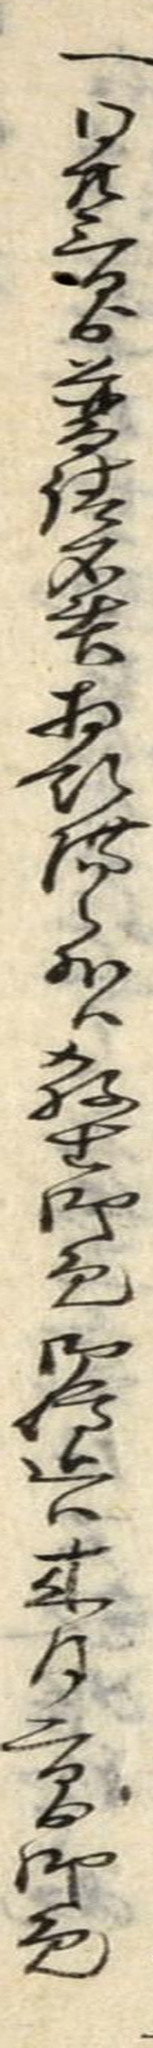一同廿三日ゟ普請不苦拝領場之外は殺生御免御停止は来月二日ゟ御免

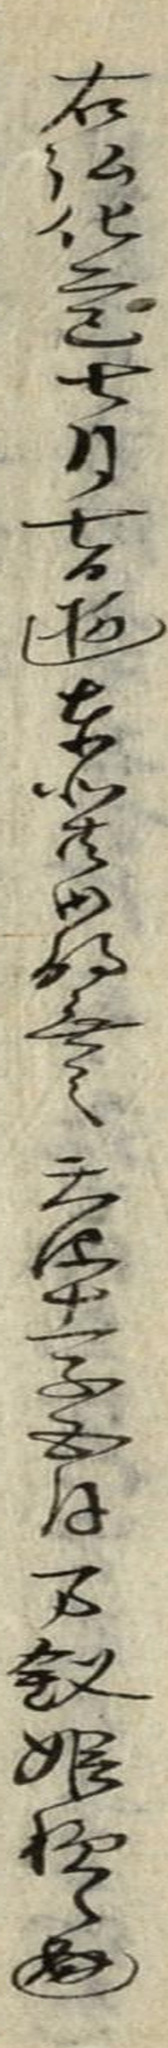右弘化二巳七月七日逝東北共御触無之天保十一子五月万釵姫様之通
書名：御停止異変死失
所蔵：福井県文書館 Fukui Prefectural Archives
